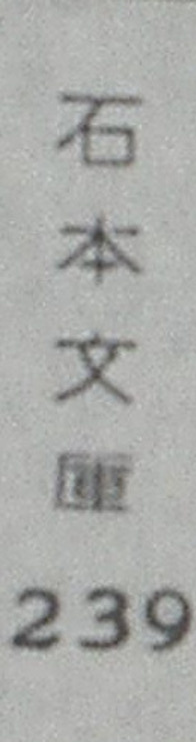石本文庫

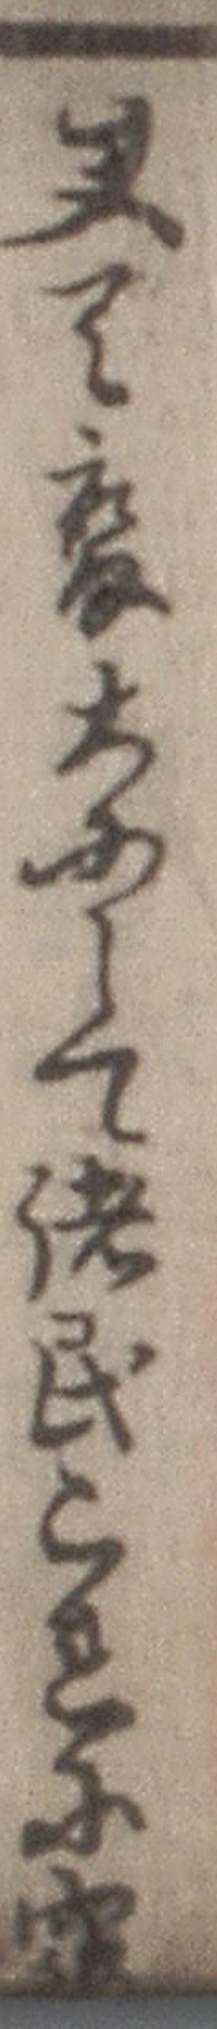夫天変大にして諸民これに窮？
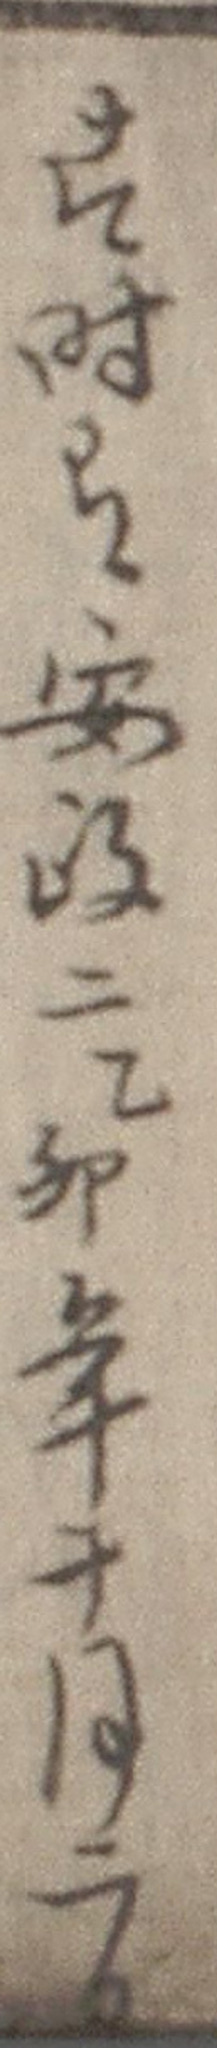す時者安政二乙卯年十月二日
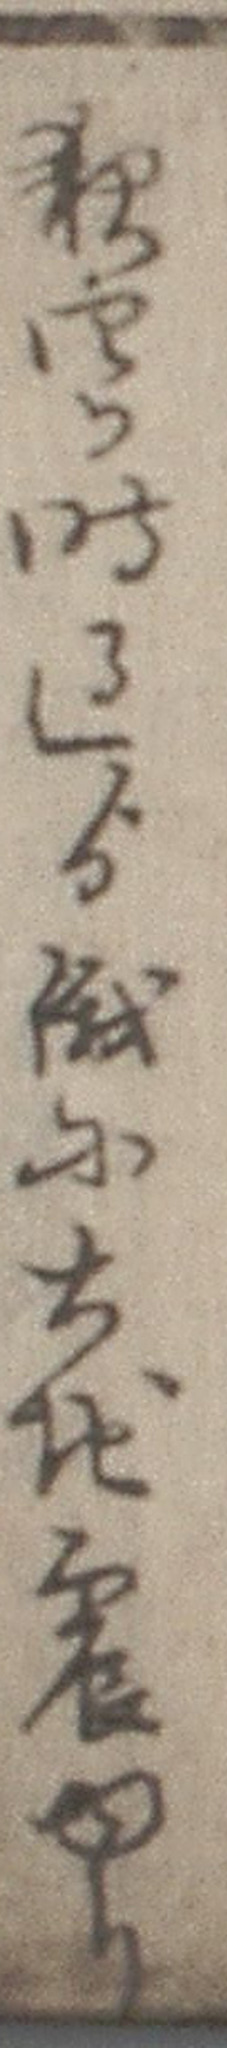夜四つ時過ゟ俄に大地震ゆり
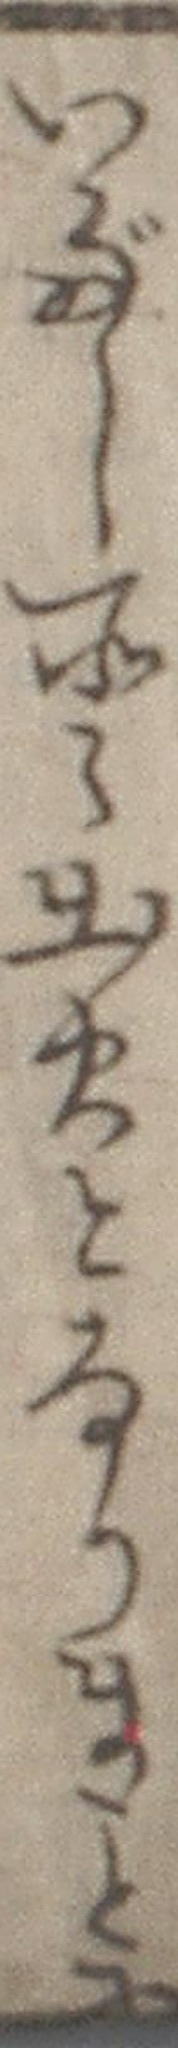いだし所々出火となりまことに
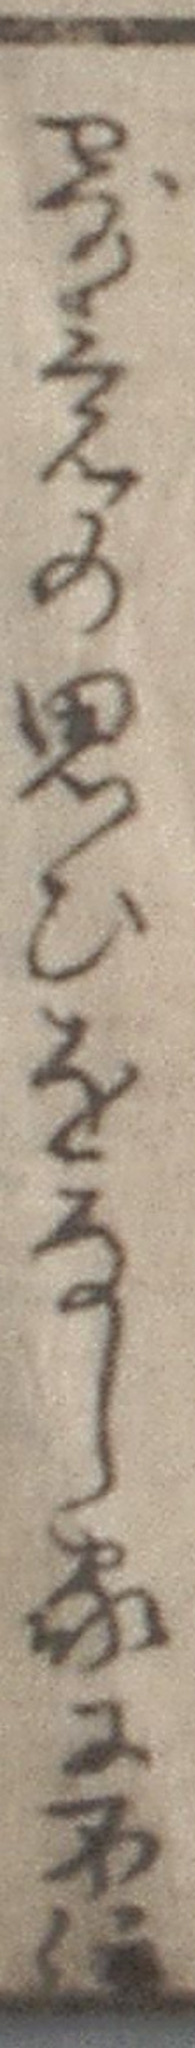寄意の思ひをなし家に不信
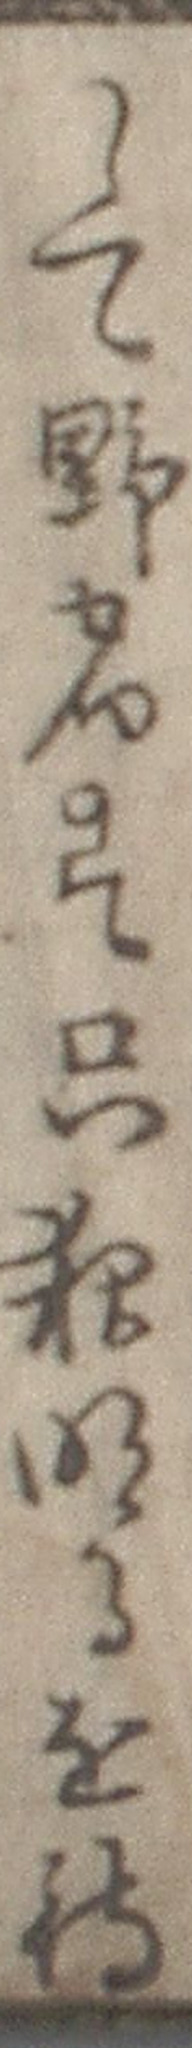して野宿者只夜明るを待
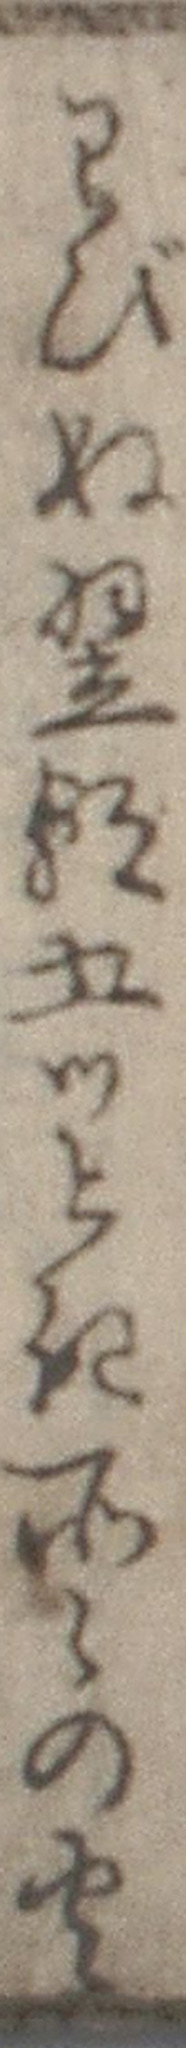わびぬ翌朝五ツとき所々の空
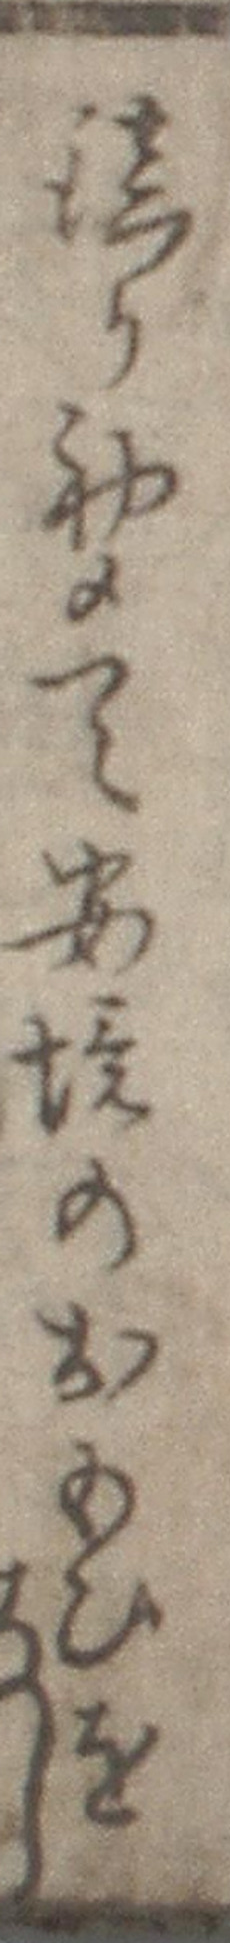清り初メて安境のおもひをなし
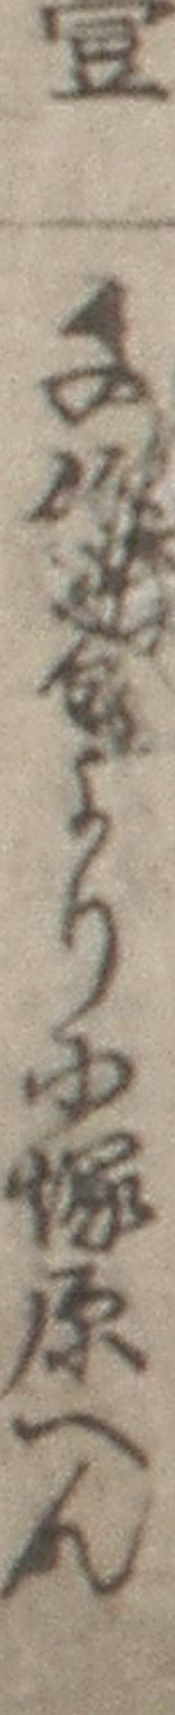壱千住通りより小塚原へん
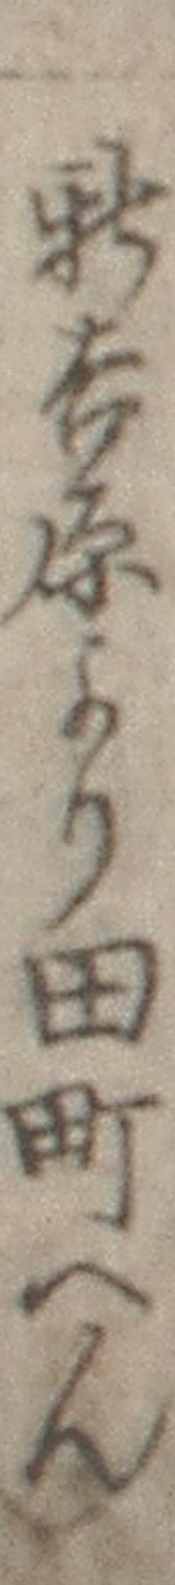二新吉原より田町へん
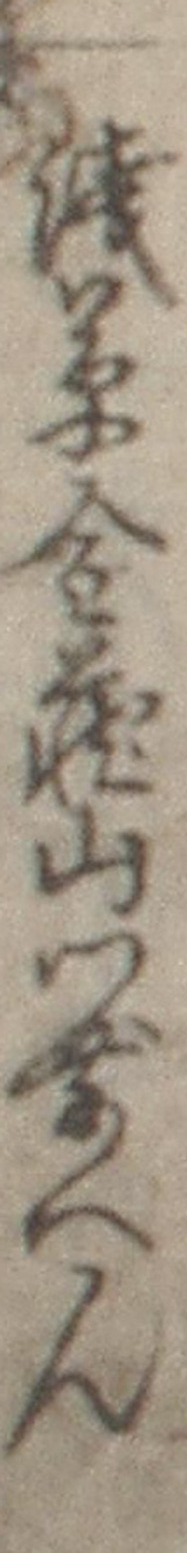三浅草金龍山門前へん
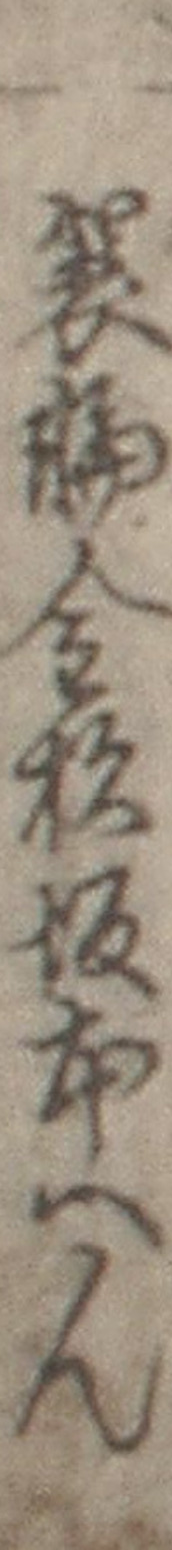四簑輪金杉坂本へん
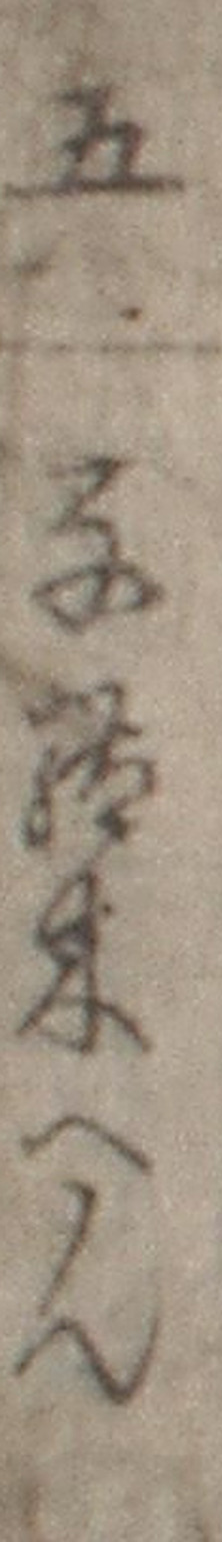五千駄木へん

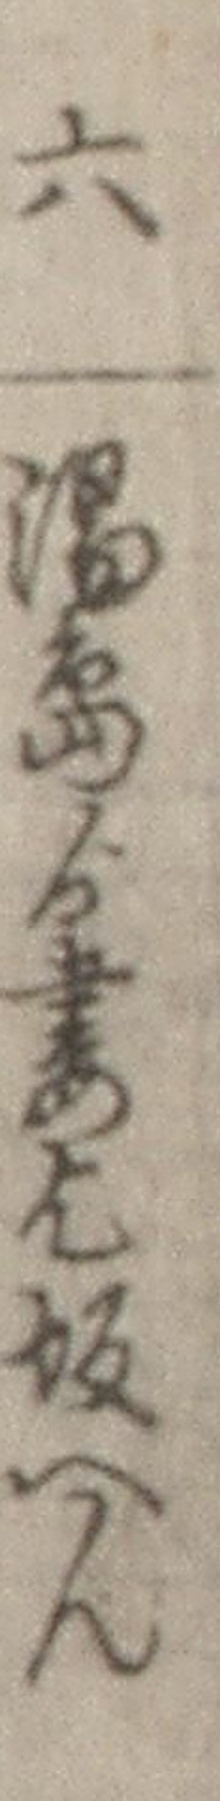六湯島ゟ妻乞坂へん
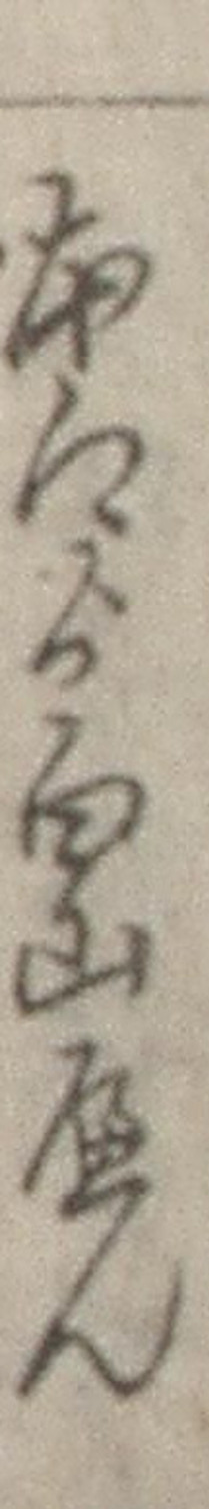七本郷ゟ白山遍ん
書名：江戸　大地震臣細録　全
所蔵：東京大学地震研究所図書室 Earthquake Research Institute Library, The University of Tokyo, JAPAN
